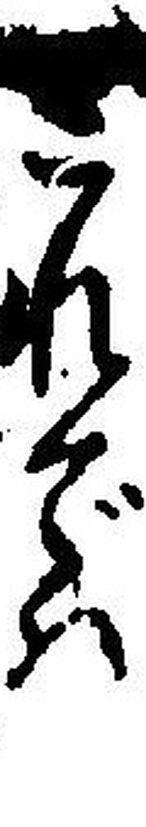これでは
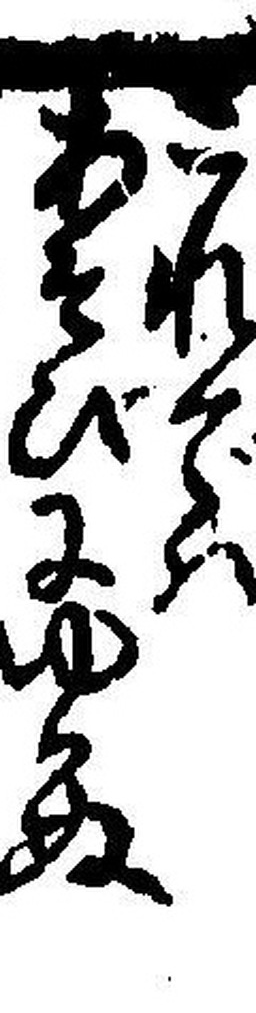あそびにゆかぬ
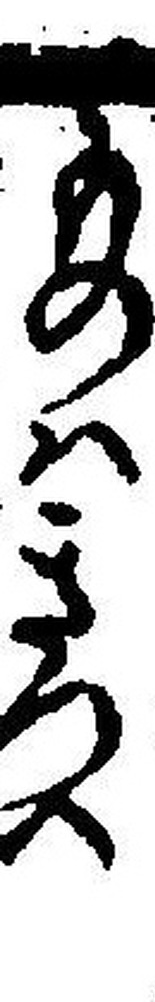ものはきつい
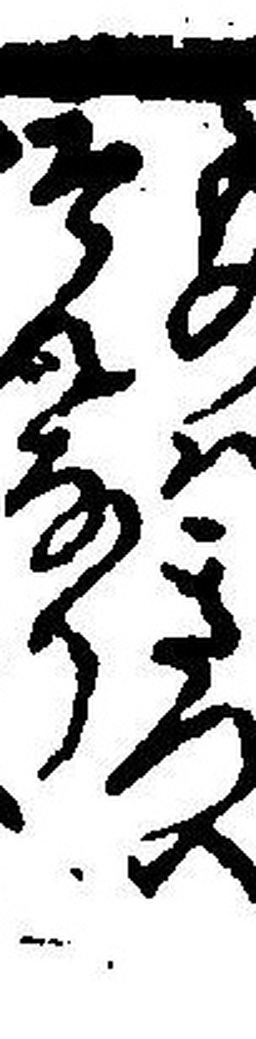そんなり
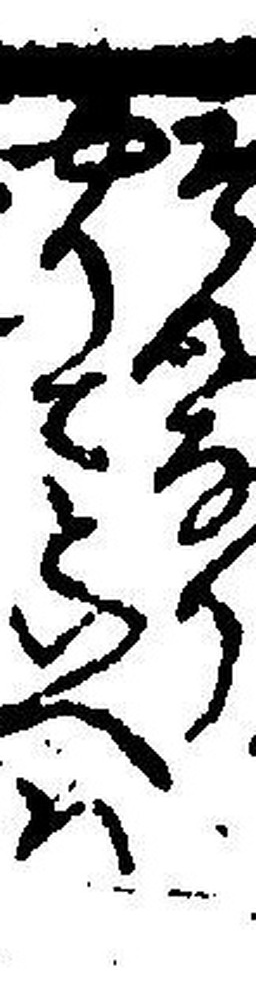やりてといへは
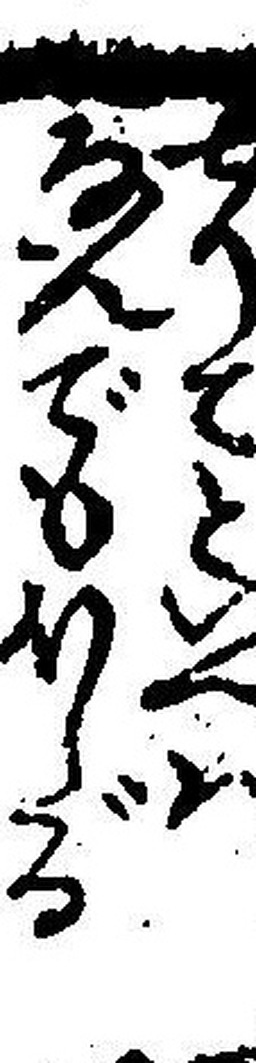なんでもほしがる
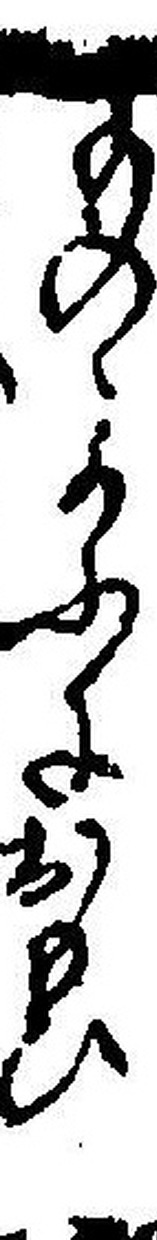ものゝよふにおもひ
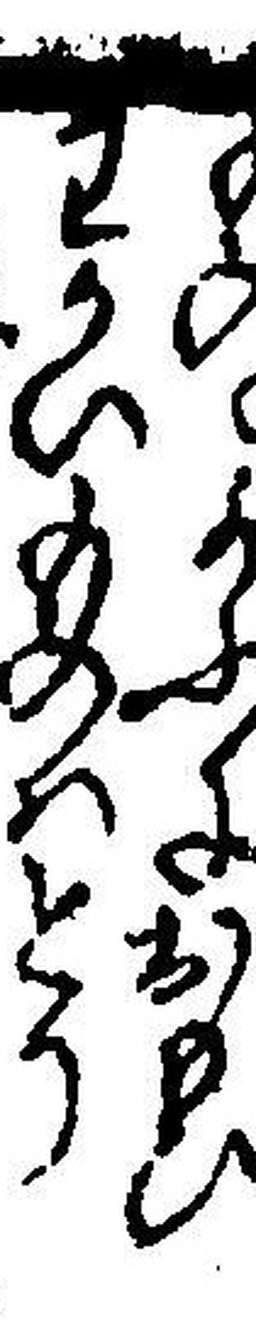わかいものはとり
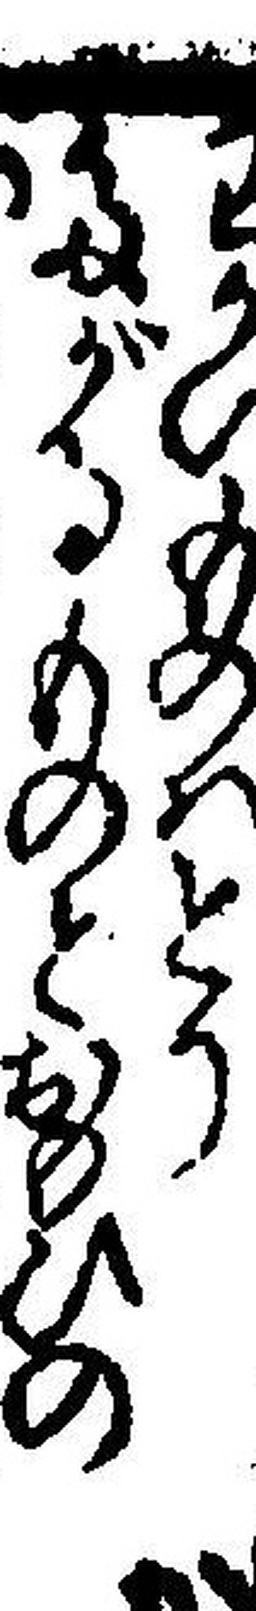たがるものとおもひの
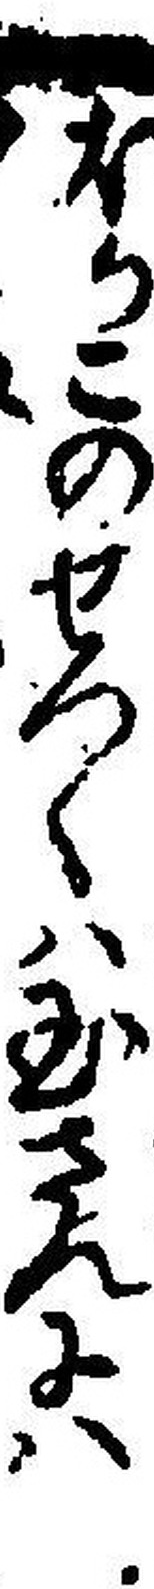ほかこのせつくは玉さんに
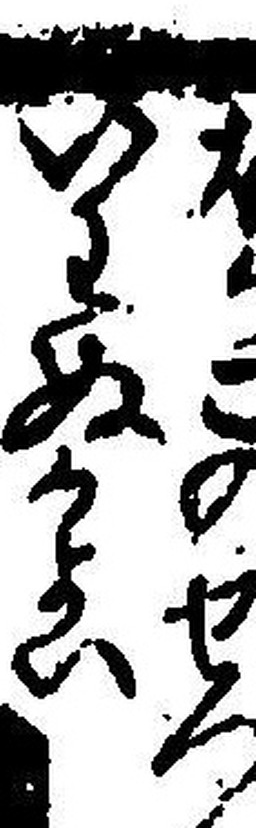いわぬかよい
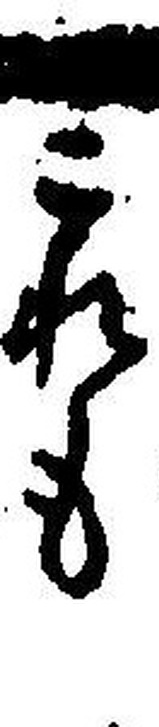これも
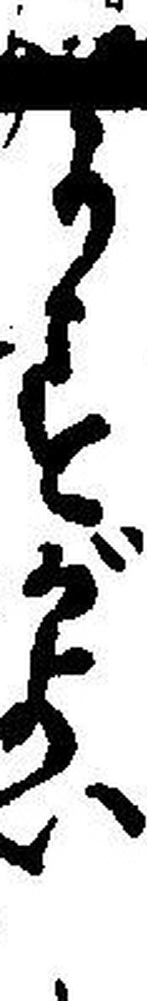よすがよい
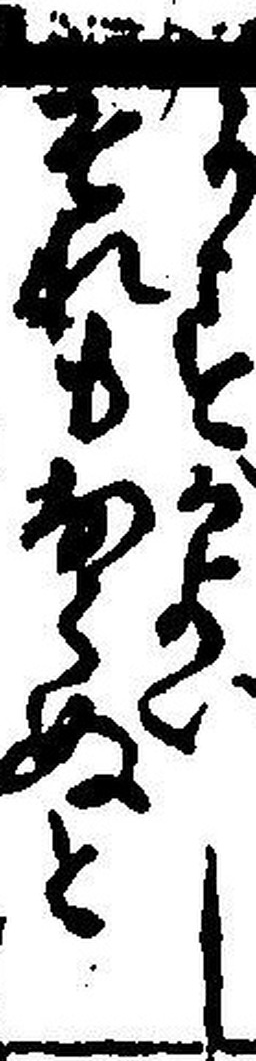それもならぬと
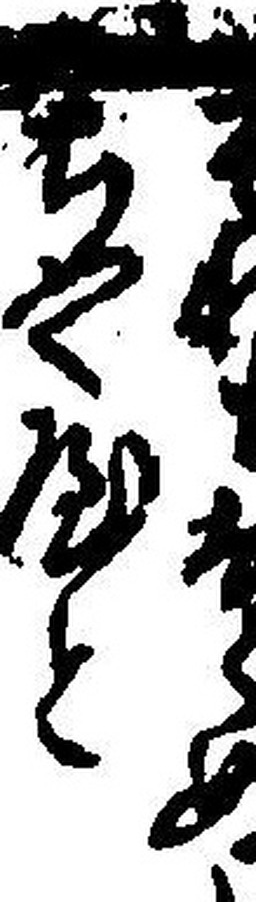ちや屋と
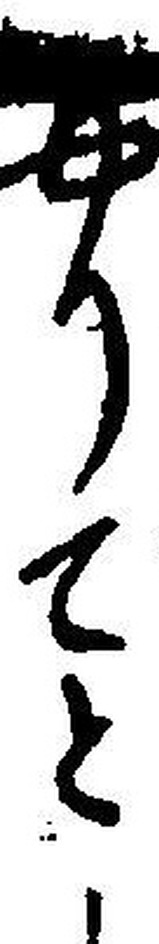やりてと
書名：間違狐之女郎買 / 市場通笑作
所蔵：東京大学総合図書館 General Library in the University of Tokyo, JAPAN
